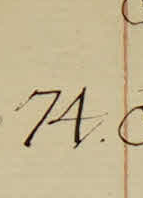74.
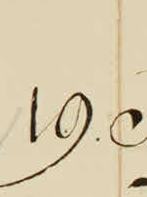19.
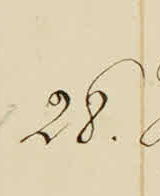28.
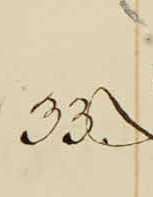33.
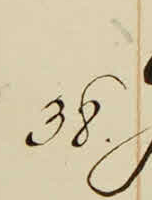38.
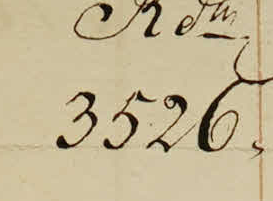3526
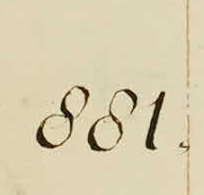881
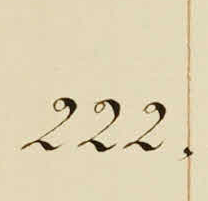222
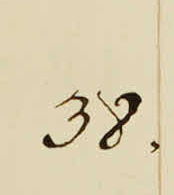38
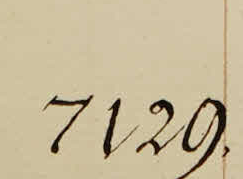7129
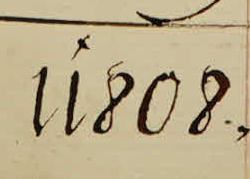11808
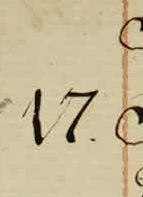17.
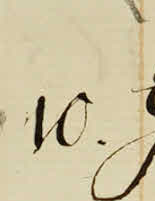10.
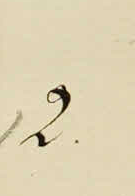2.
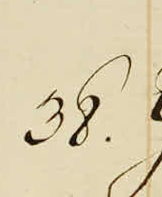38.
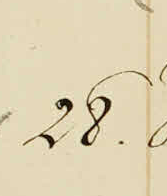28.
